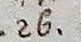26
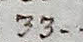33
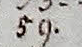59
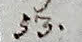53
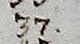37
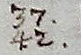42
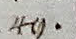49
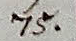75
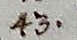43
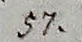57
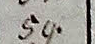59.
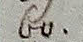60
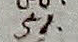51
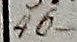46
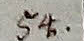54
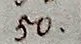50
